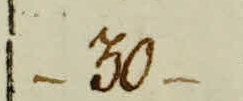- 30 -
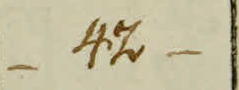- 42 -
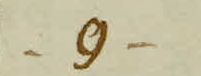- 9 -
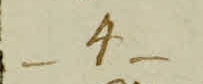- 4 -
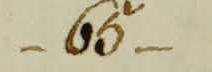- 65 -
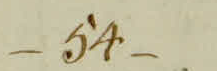- 54 -
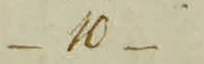- 10 -
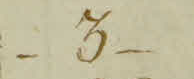- 3 -
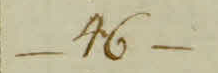- 46 -
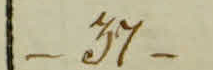- 37 -
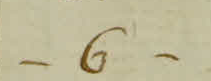- 6 -
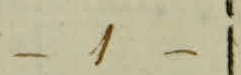- 1 -
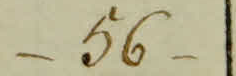- 56 -
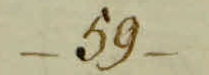- 59 -
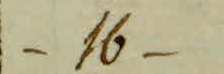- 16 -
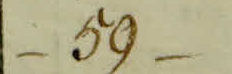- 59 -
